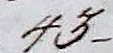43
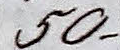50
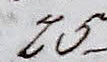25
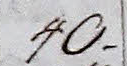40
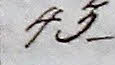43
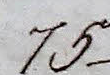75
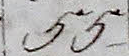55
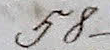58
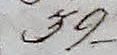39
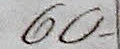60
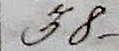38
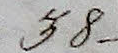38
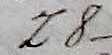28
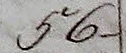56
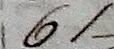61
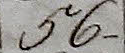56
